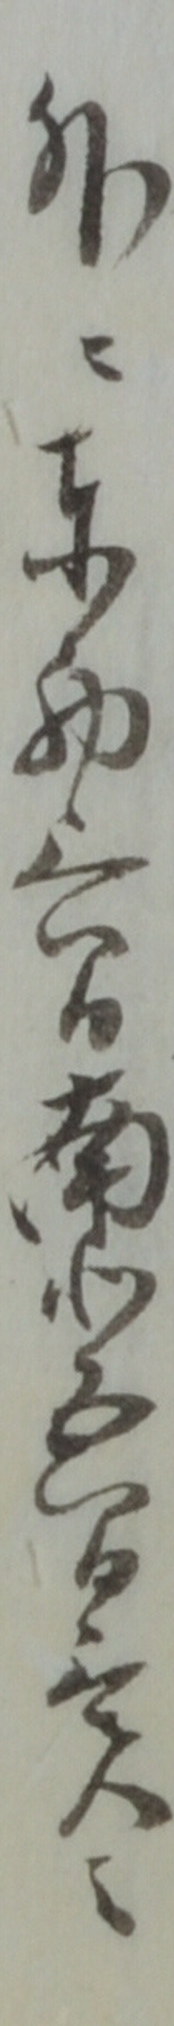外ニ東西三間南北五間壱尺之

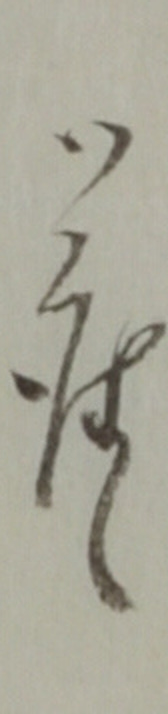御座候
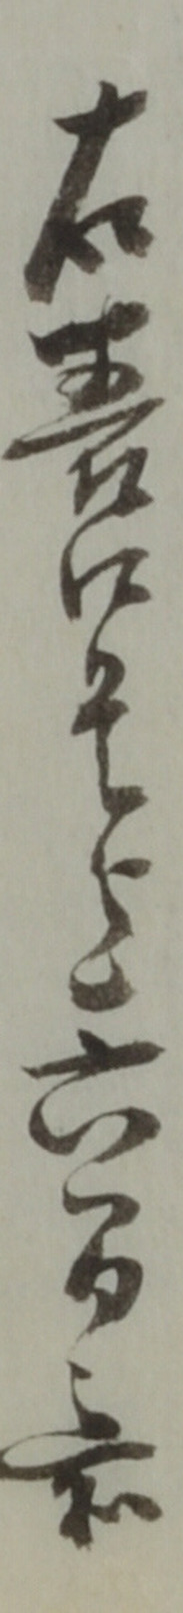右裏口是迄六間之所
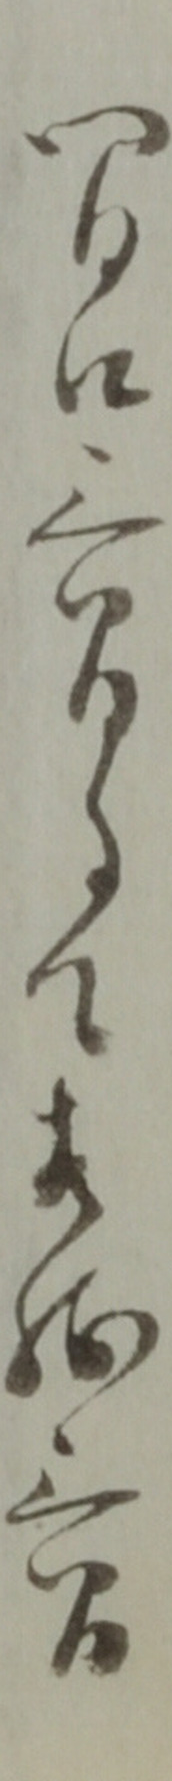間口三間にて相極三間
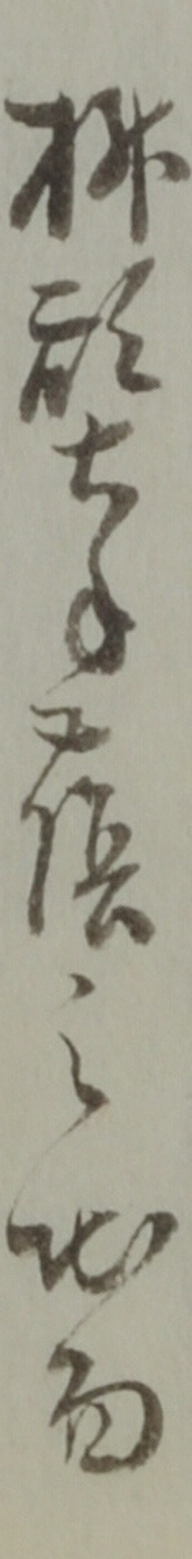枡形土手蔭之地面
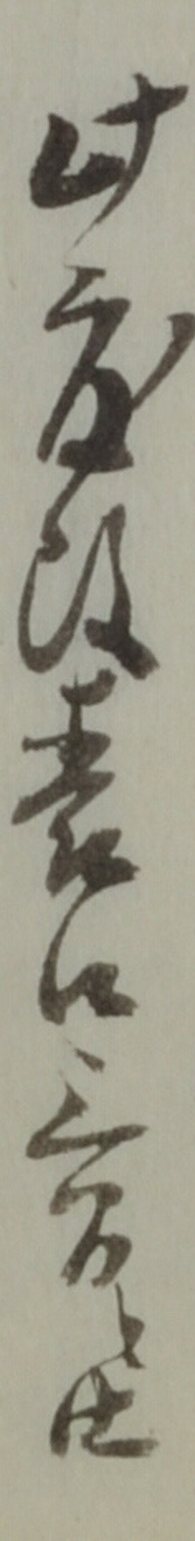此度改裏口三間と仕
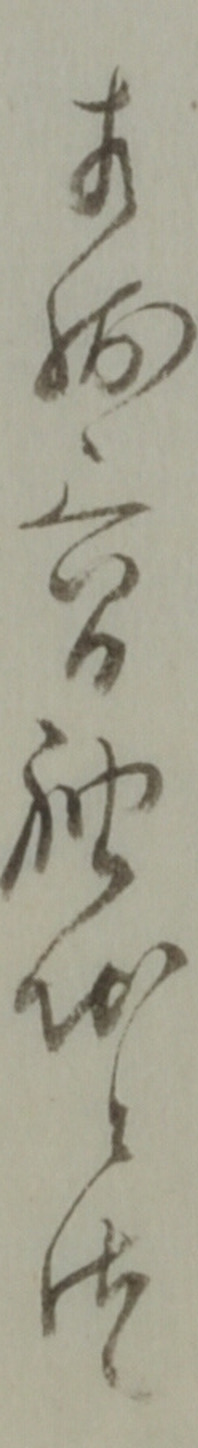相残三間袖地と仕候
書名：屋敷表口裏行書上
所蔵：伊那市立高遠町図書館・合同会社AMANE
